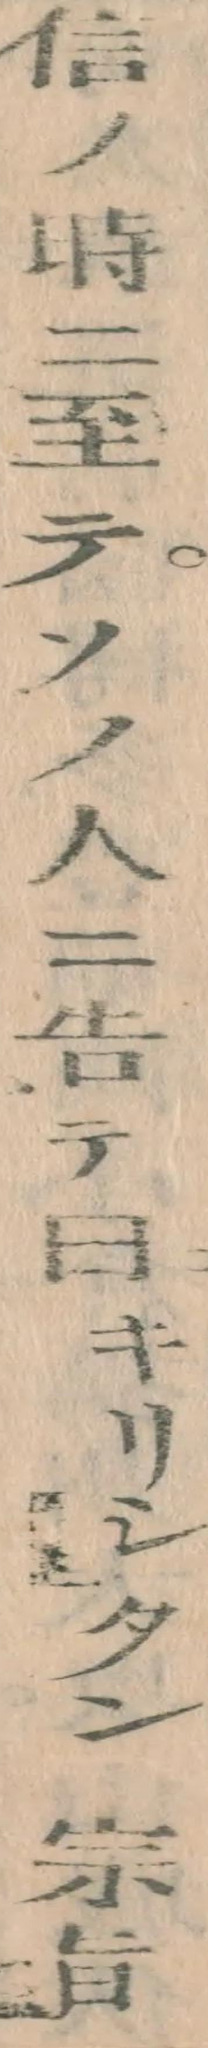信ノ時ニ至テ。ソノ人ニ告テ曰。キリシタン宗旨
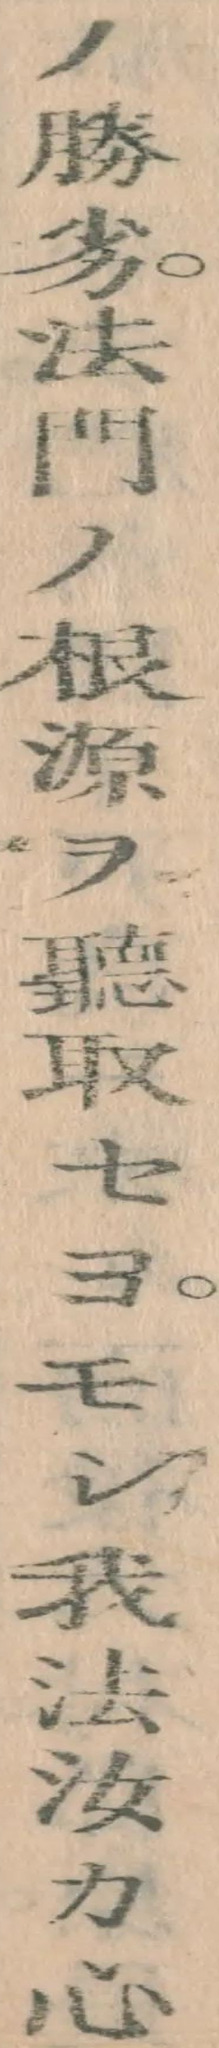ノ勝劣。法門ノ根源ヲ聴取セヨ。モシ我法汝カ心
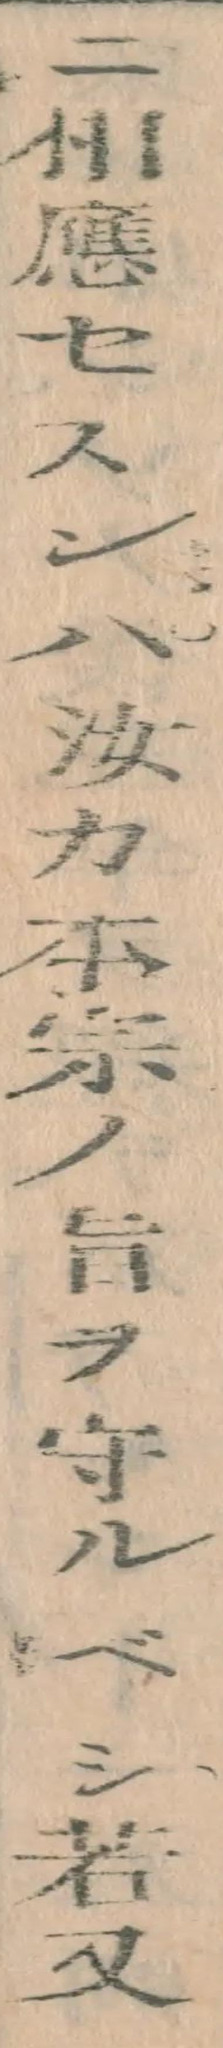ニ相応セスンハ。汝カ本宗ノ旨ヲ守ルベシ。若又
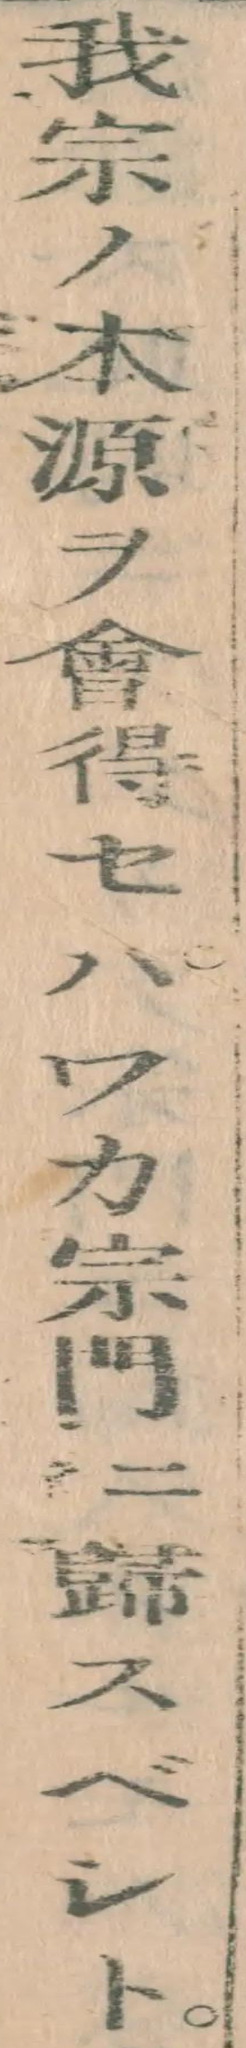我宗ノ本源ヲ会得セハ。ワカ宗門ニ帰スベシト
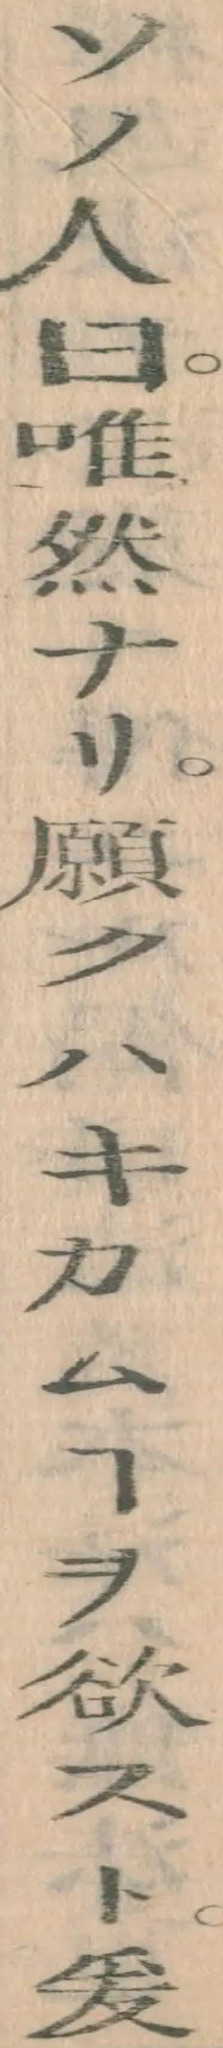ソノ人曰。唯然ナリ。願クハキカムヿヲ欲スト。爰
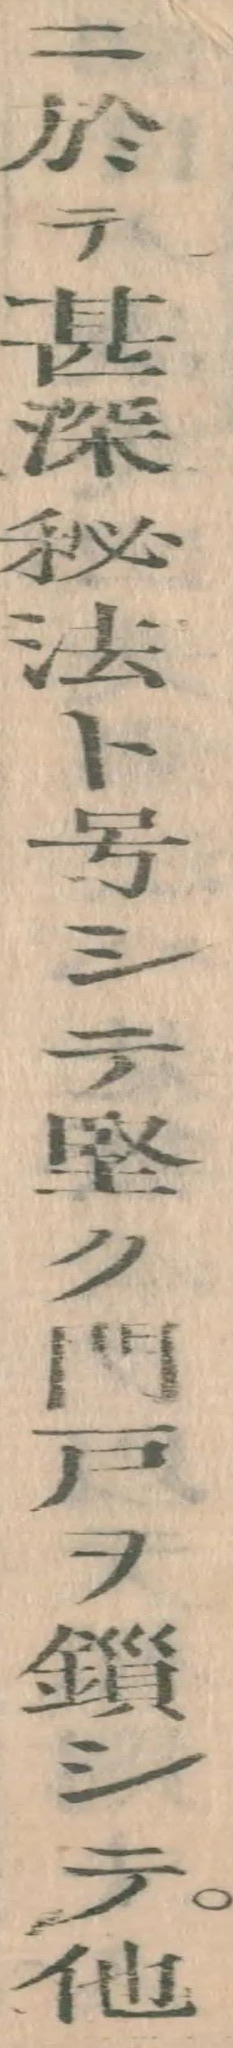ニ於テ甚深秘法ト号シテ堅ク門戸ヲ鎖シテ。他
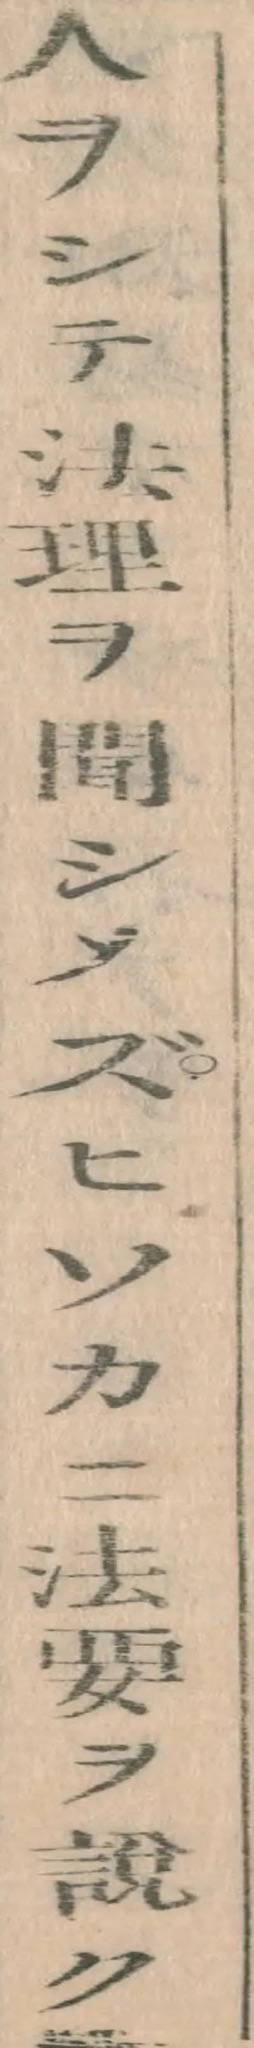人ヲシテ法理ヲ聞シメズ。ヒソカニ法要ヲ説ク
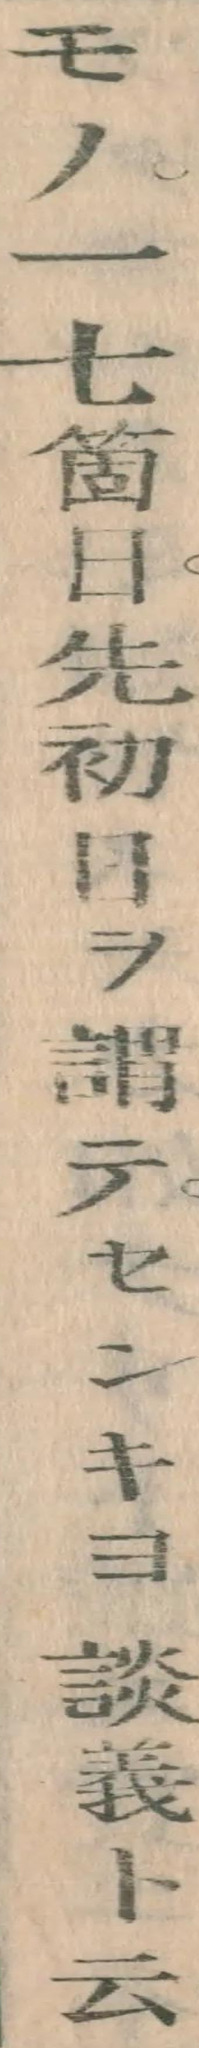モノ一七箇日。先初日ヲ謂テ。センキヨ談義ト云。
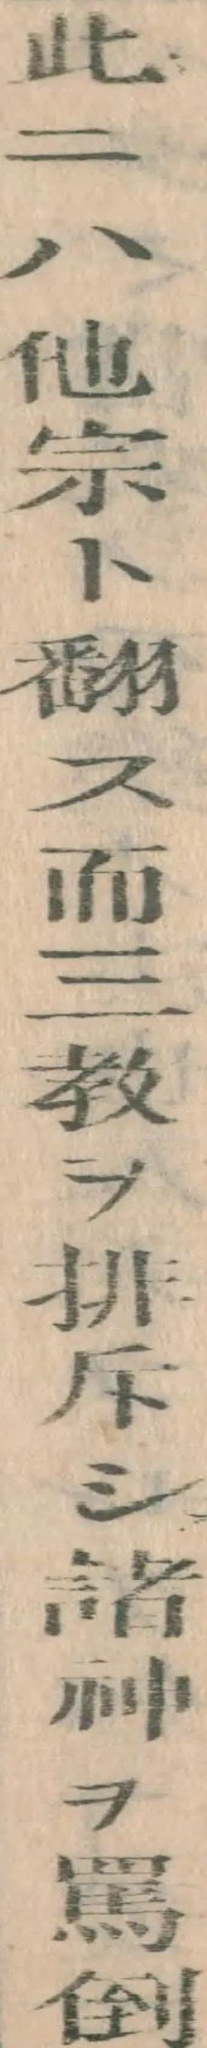此ニハ他宗ト翻ス而三教ヲ排斥シ。諸神ヲ罵倒
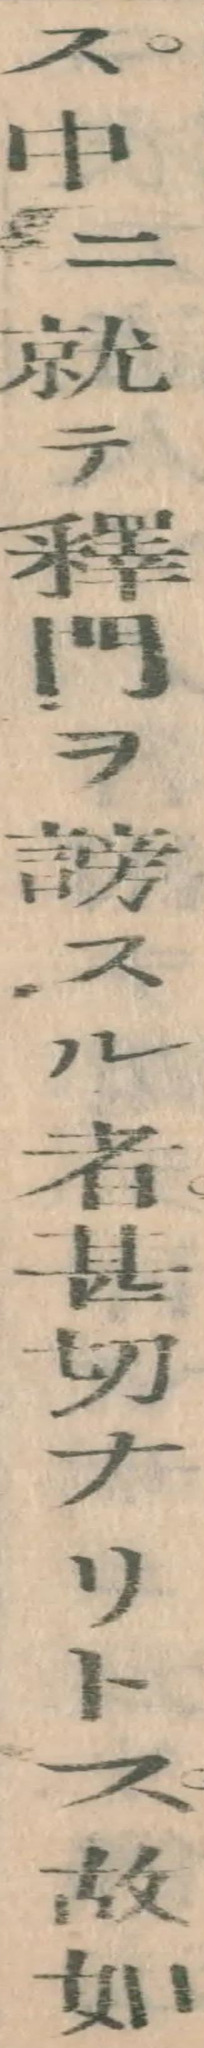ス。中ニ就テ釈門ヲ謗スル者。甚切ナリトス。故如
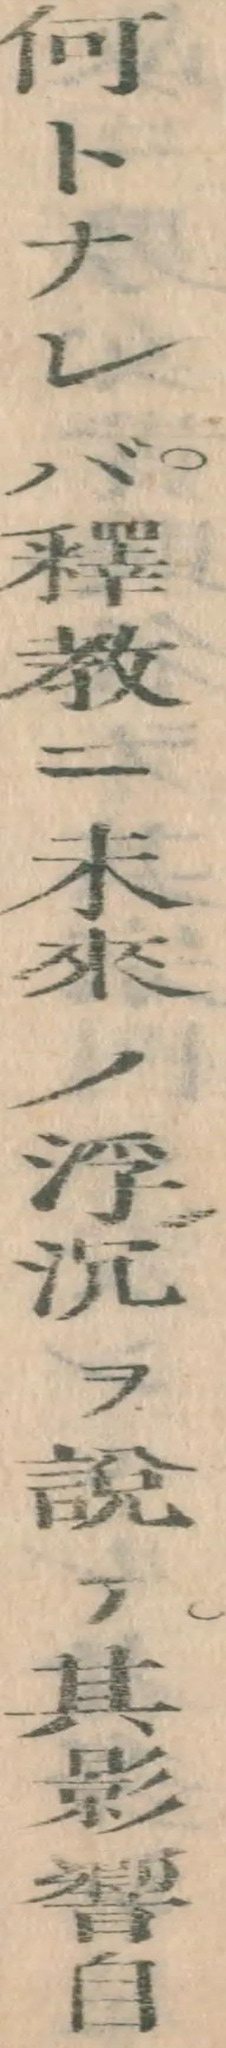何トナレバ。釈教ニ未来ノ浮沈ヲ説テ。其影響自
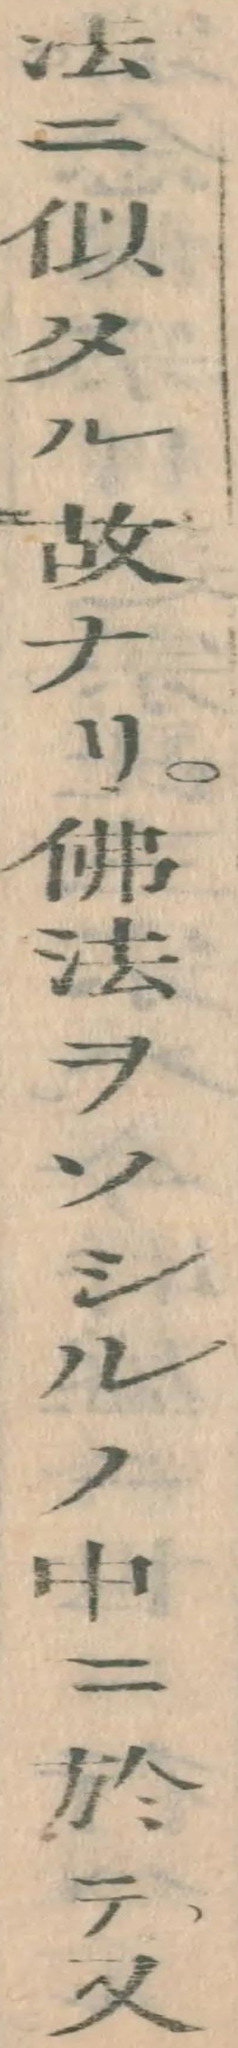法ニ似タル故ナリ。仏法ヲソシルノ中ニ於テ。又
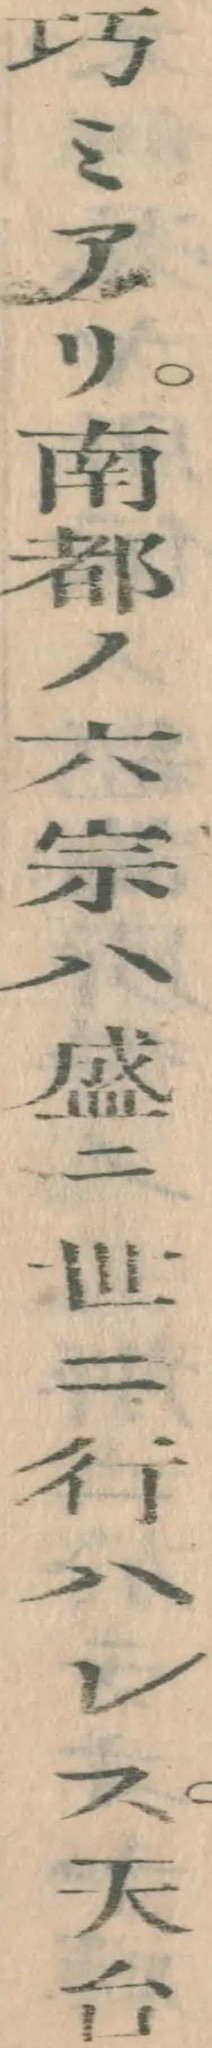巧ミアリ。南都ノ六宗ハ盛ニ世ニ行ハレス。天台
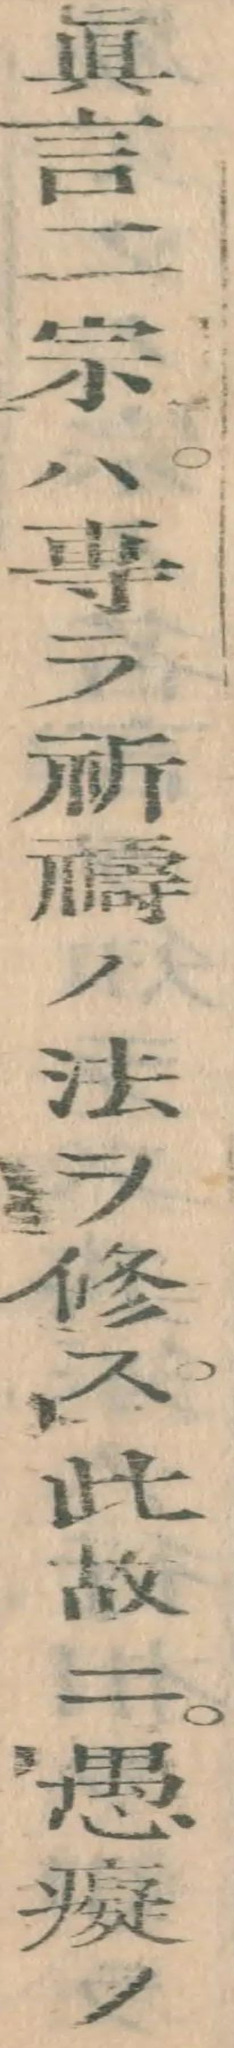真言二宗ハ。専ラ祈祷ノ法ヲ修ス。此故ニ。愚痴ノ

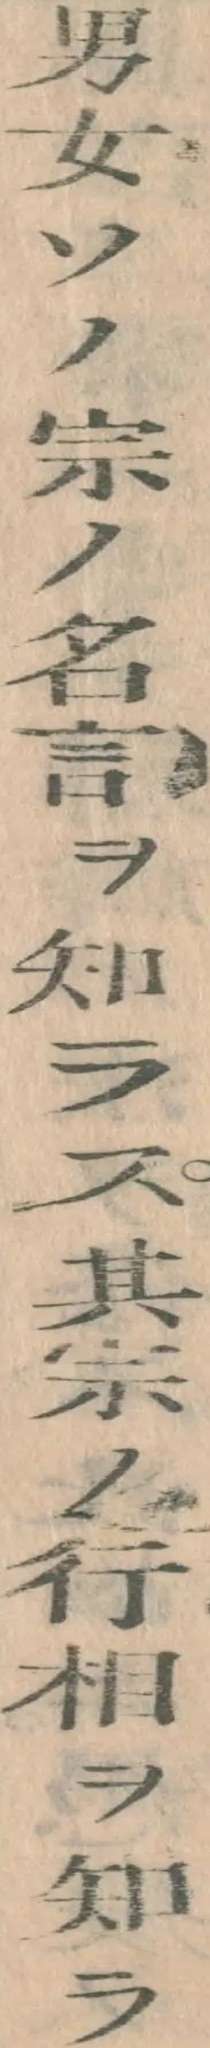男女ソノ宗ノ名言ヲ知ラス。其宗ノ行相ヲ知ラ
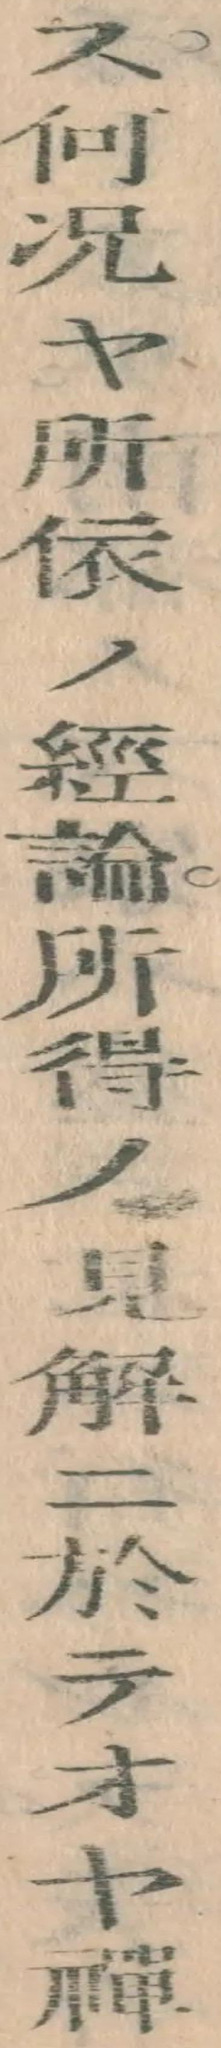ス。何況ヤ所依ノ経論。所得ノ見解ニ於テオヤ禅
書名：南蛮寺興廃記
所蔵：国立国会図書館 National Diet Library, JAPAN
